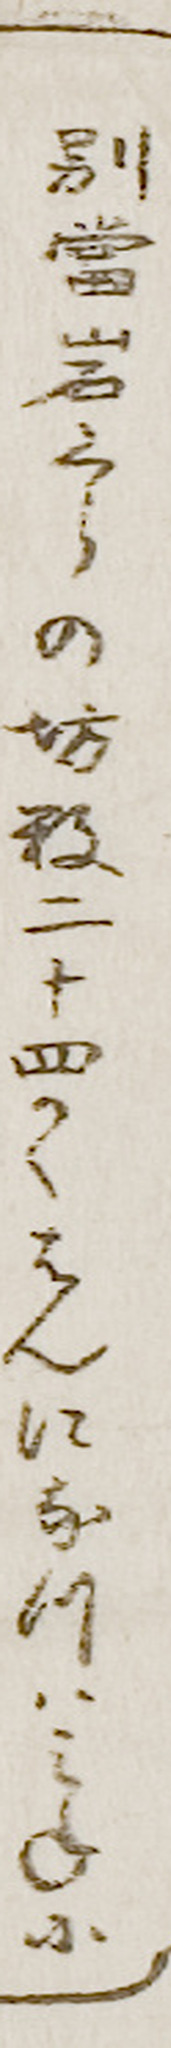別当岩くらの坊数二十四かくばんになつはみねに
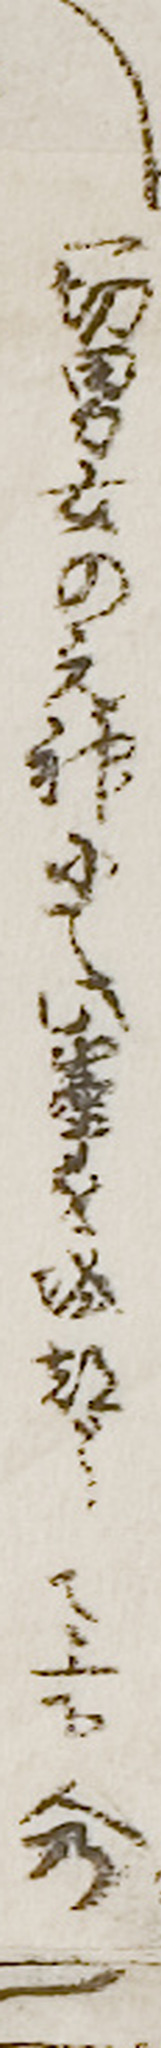一切男女の元神にて此峰を城都として上下人の
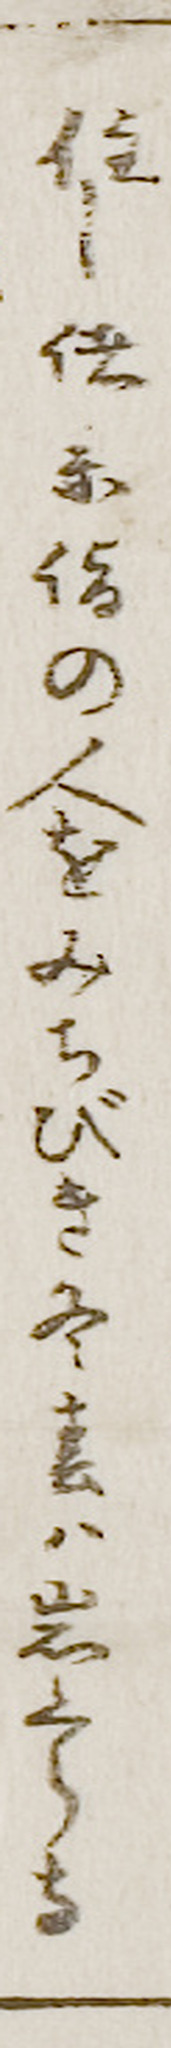住し諸参詣の人をみちびき冬春は岩くら寺
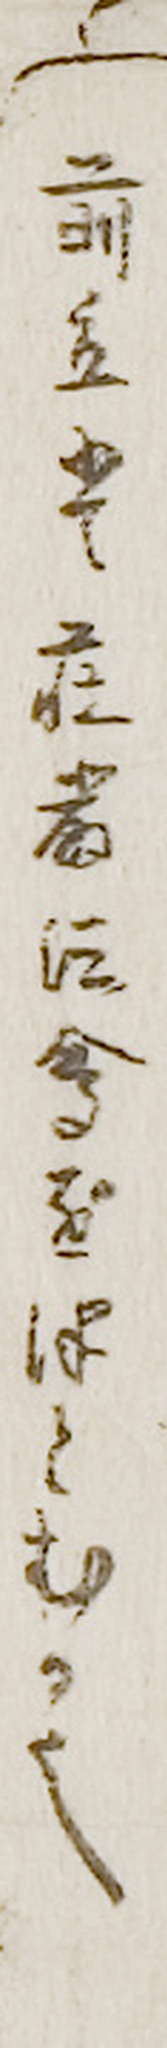前立にて荘番法会をつとむる也
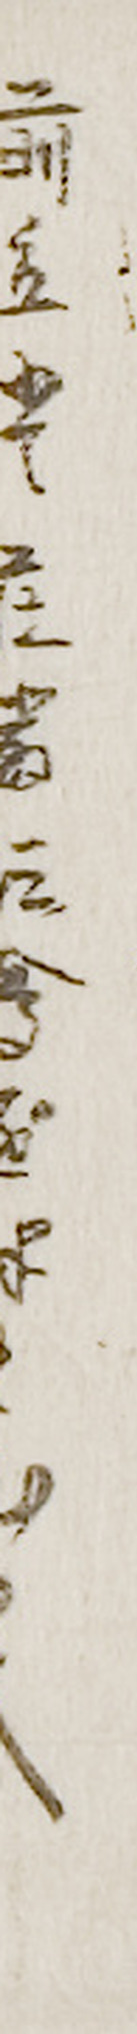前立にて荘番法会をつとむる也
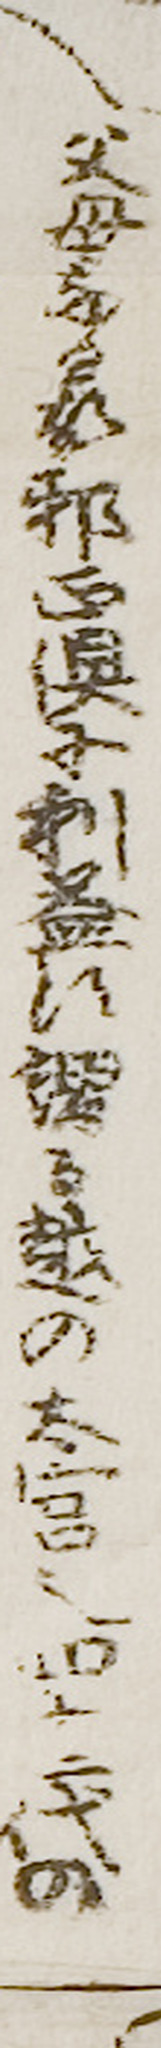父母なる故邪正倶に利益す謂る越の太宮也四十二代の
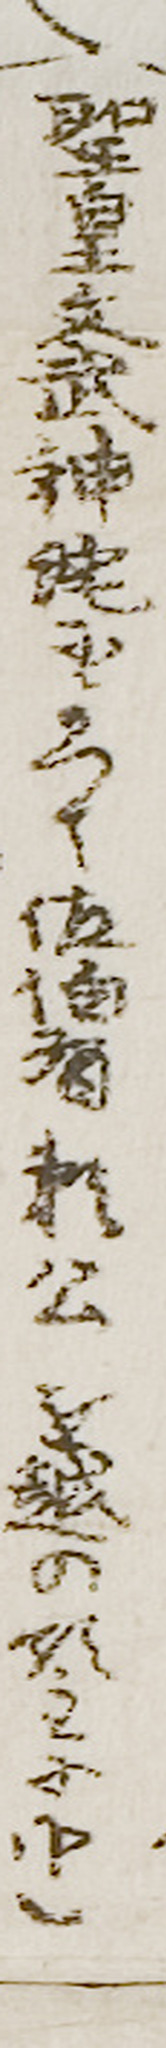聖皇文武神詫によつて佐伯有頼公を越の領主に下し
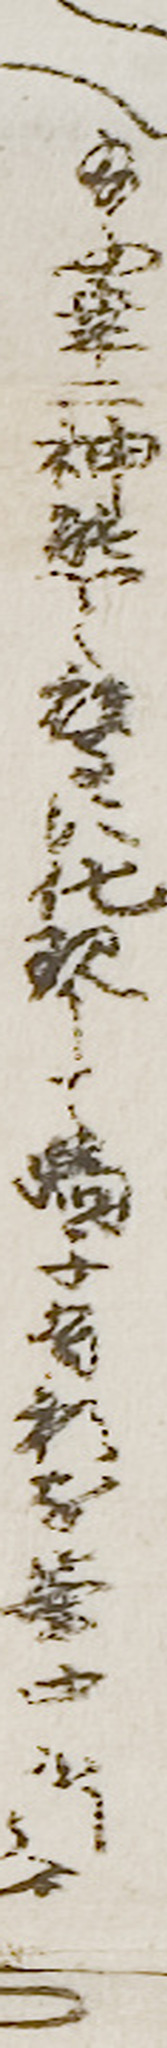給ふ幸二神熊と鷹に化現して嫡子有頼を峯中に引入す
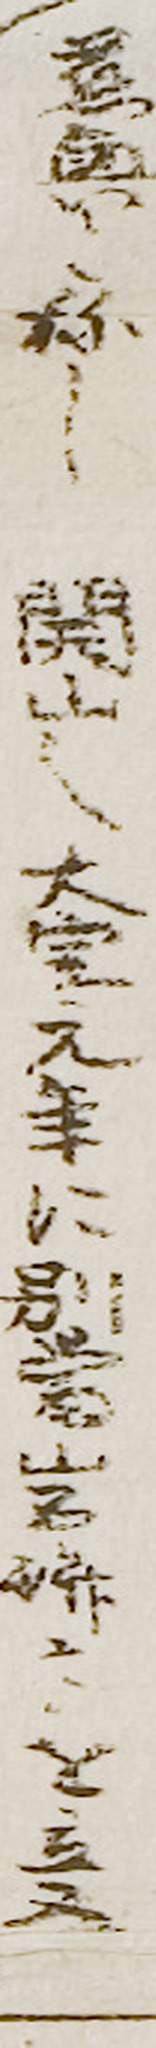慈興と称し開山也大宝元年に別当岩峅寺を立又
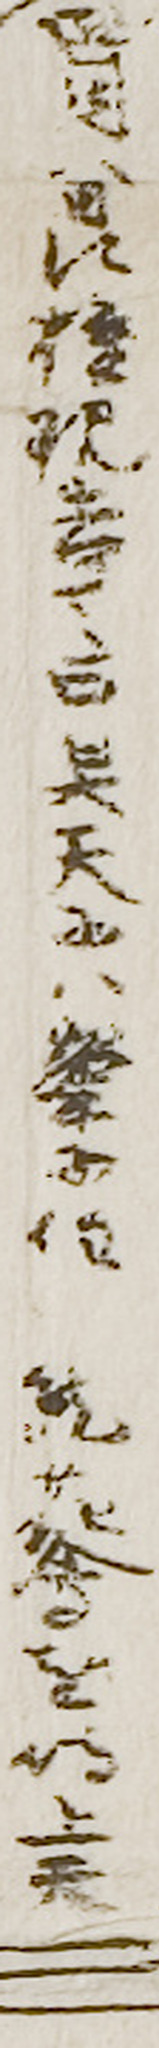四月八日に権現告て曰昊天には峯に住し龍花会を持上天
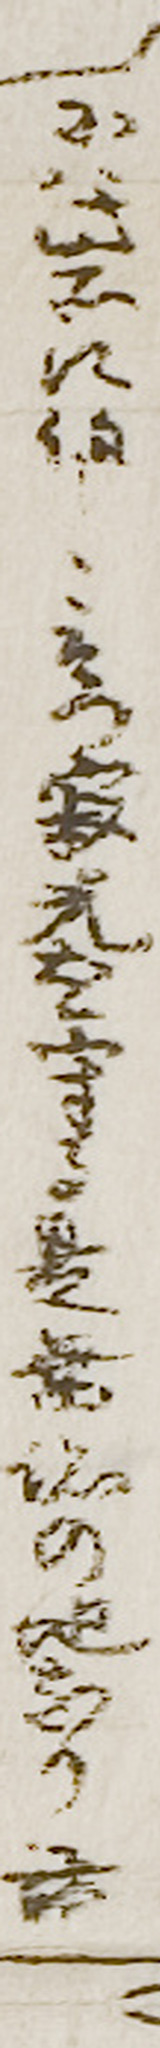には此所に住しとそつ寂光を守る是垂跡の地なり諸
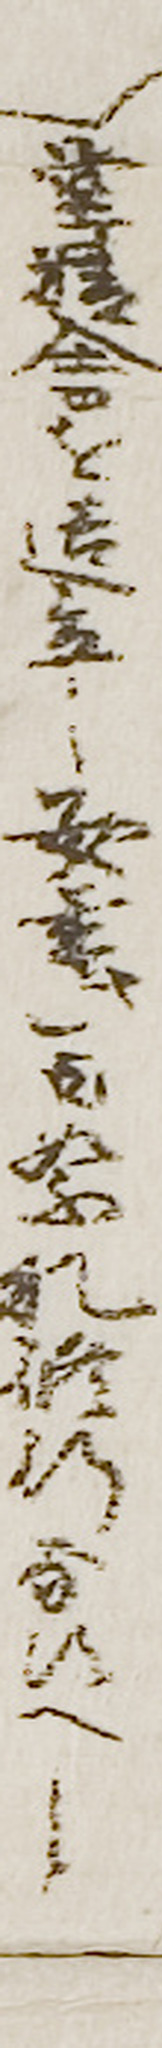堂精舎を造立し毎年此日祭礼修行なすへしと
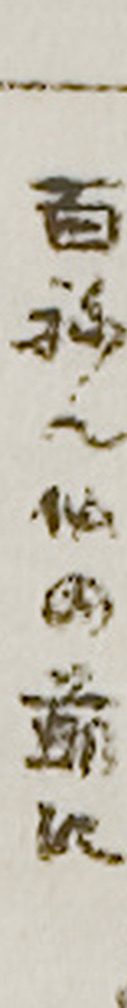百ねん仏の前に
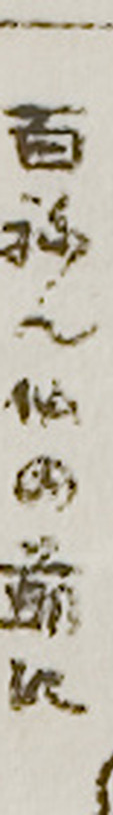百ねん仏の前に
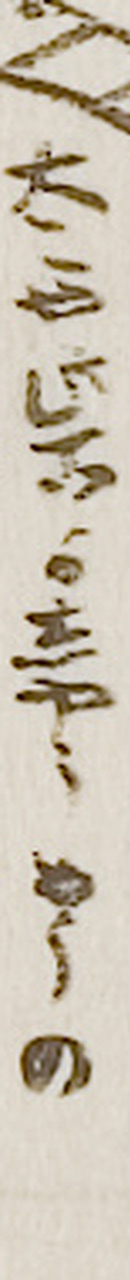大こや此所ゟしやうめうの
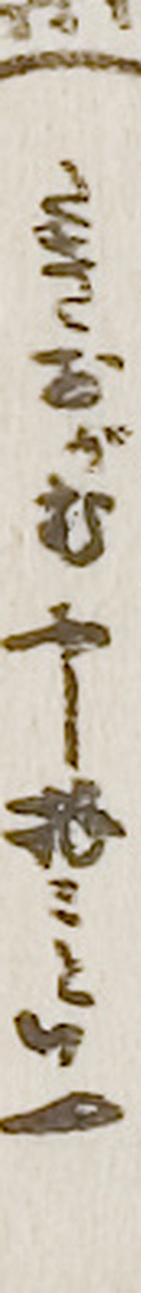たきをがむふし拝みといふ
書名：越中国立山禅定名所附図別当岩峅寺
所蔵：東京大学総合図書館 General Library in the University of Tokyo, JAPAN
